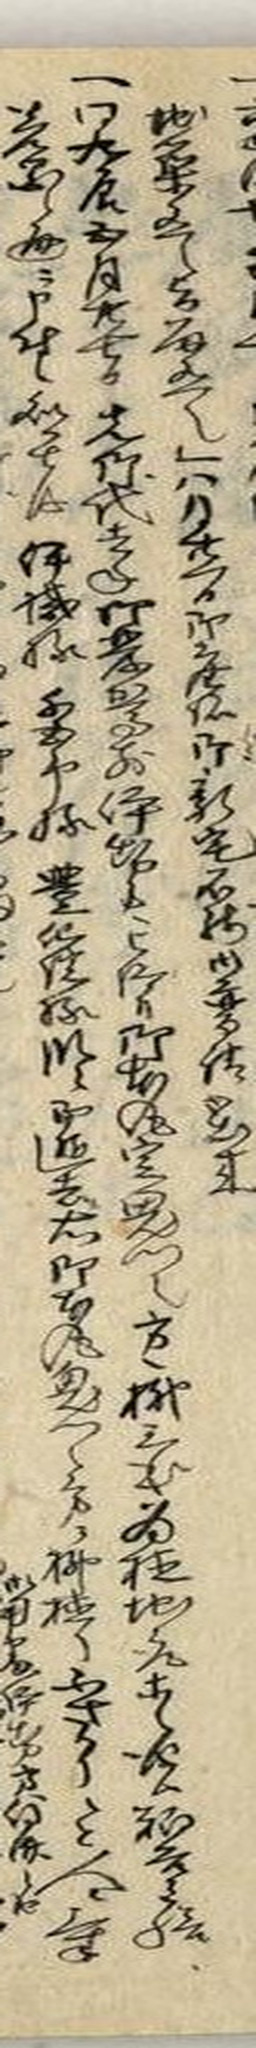差図之通に申付候処其後伊織様千五郎様豊仙院様段々御逝去右御本丸鬼門之方に柳植りふさかり候と人々気
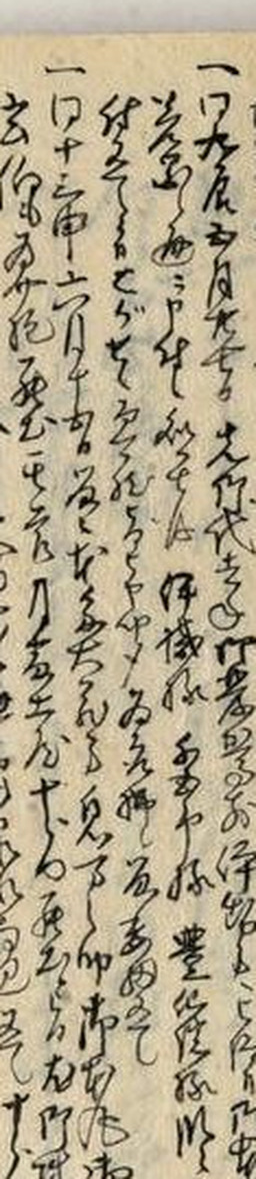付有之に付こがせ候て可然旨被申聞為取払候留委細有之
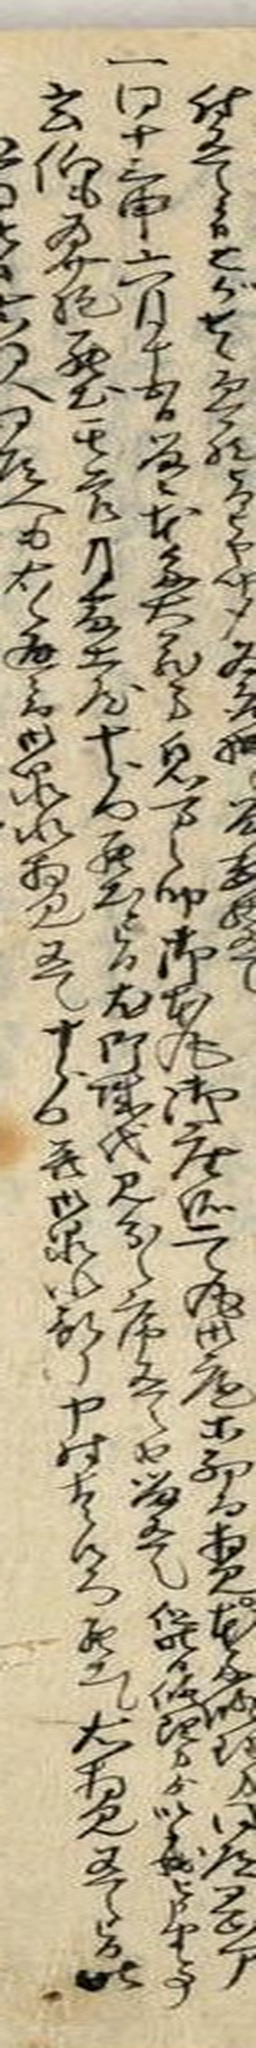但同廿日右同人同道人も右之通にて御泉水拝見有之十郎右衛門并御泉水預り中村太郎左衛門罷出候右拝見有之旨昨
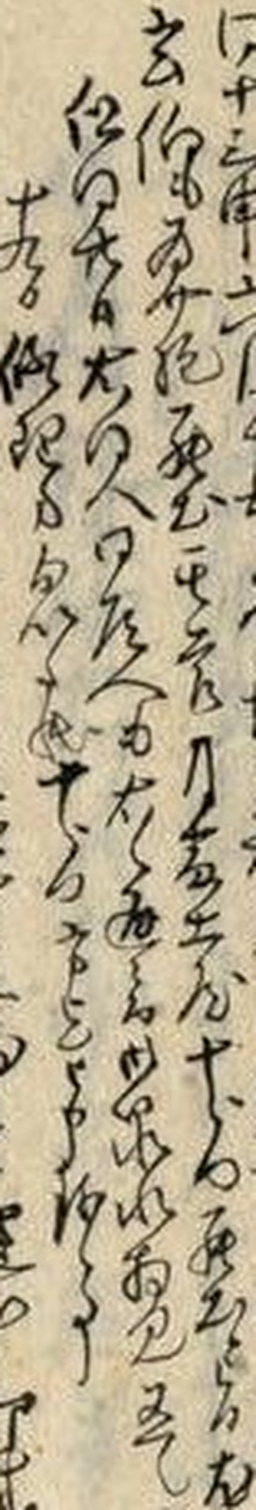十九日修理方ゟ以手紙十郎右衛門方迄被申越候事
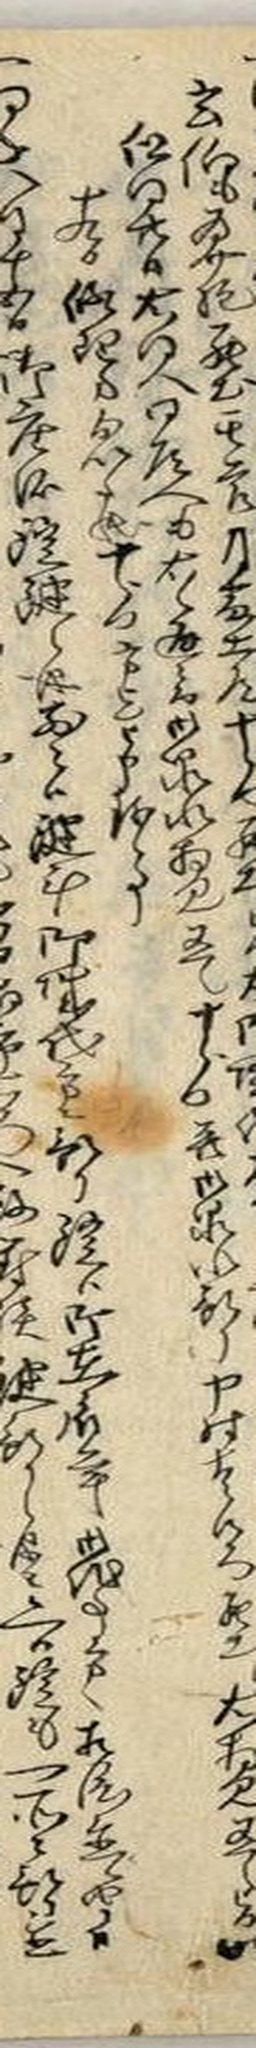一同年八月十五日御座所錠鍵之儀前々は鍵斗御城代方に預り錠は御在府年御作事方へ相渡置候由に付
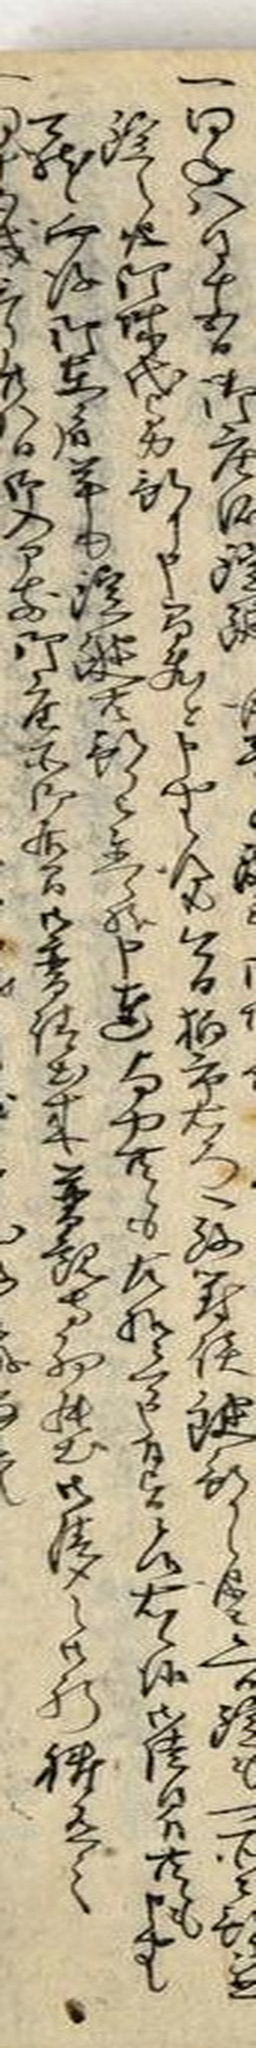一同十五戌三月廿八日御入部前御座所御居間御普請出来普観寺初罷出御請〆之御祈祷有之
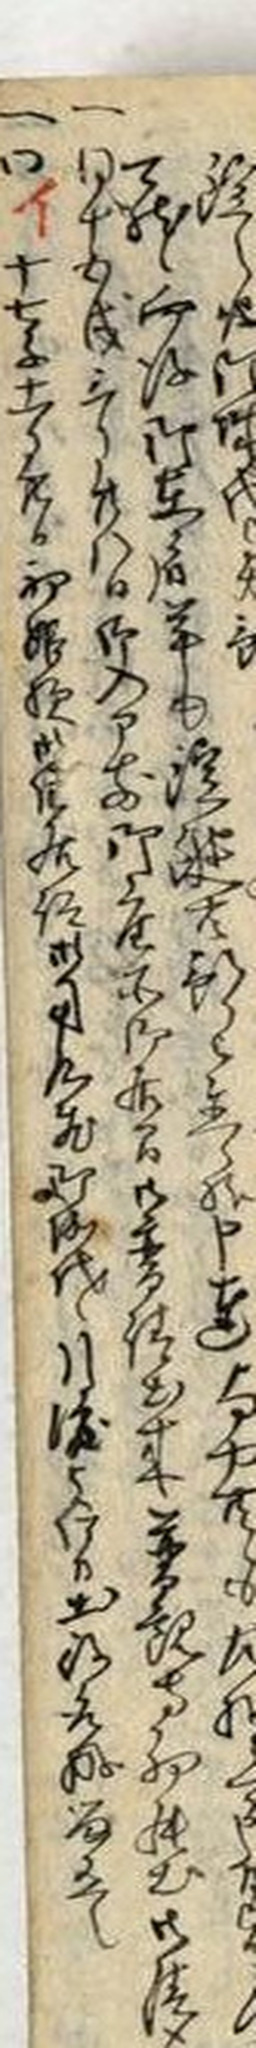一同十七子十一月廿日初姫様御住居跡御用屋敷御城代へ引渡被仰付出役取扱留有之

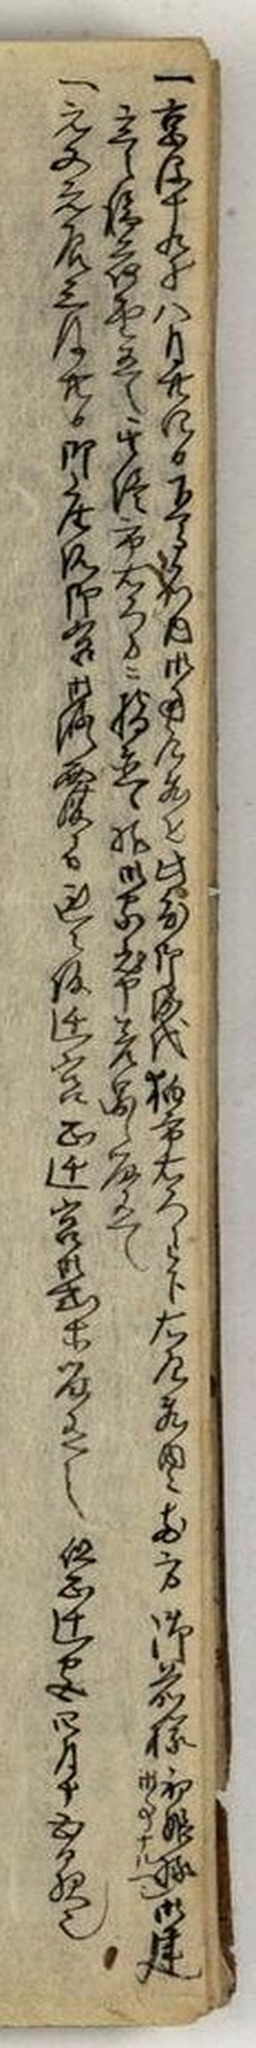立之稲荷堂有之其儘市右衛門方に指置候様御家老中差図候留有之
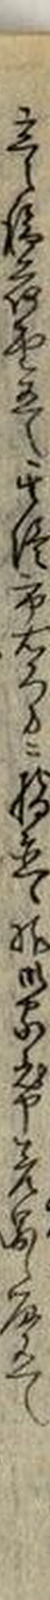立之稲荷堂有之其儘市右衛門方に指置候様御家老中差図候留有之
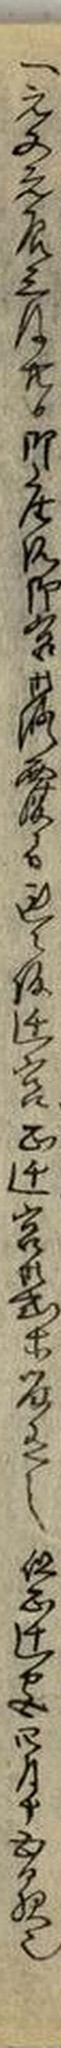一元文元辰三月廿日御座所御宮御修覆に付連々仮遷宮正遷宮御式等留有之但正遷宮四月五日夜也
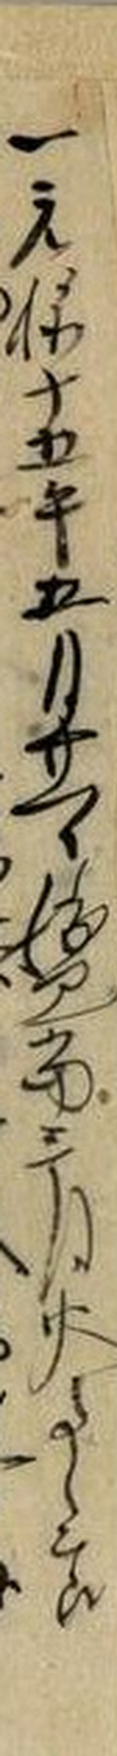一元禄十五午五月廿一日勝見当三月火事之節
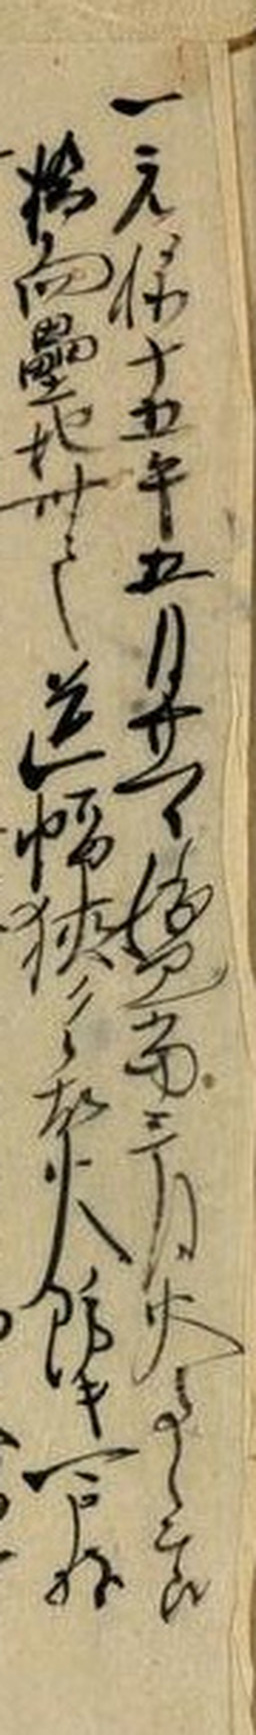橋向塁地無之道幅狭ク候故火防キ可申様
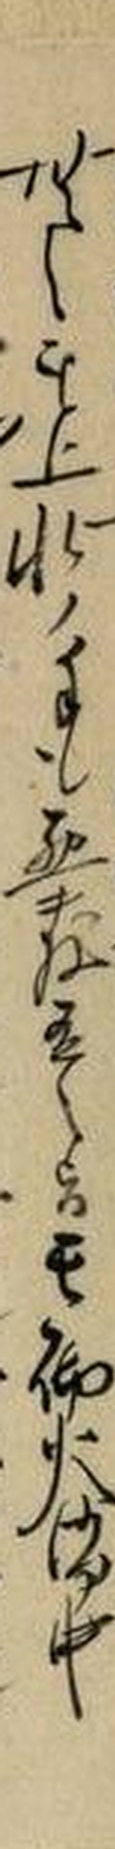無之其上水ノ手も悪敷有之旨其砌火消中
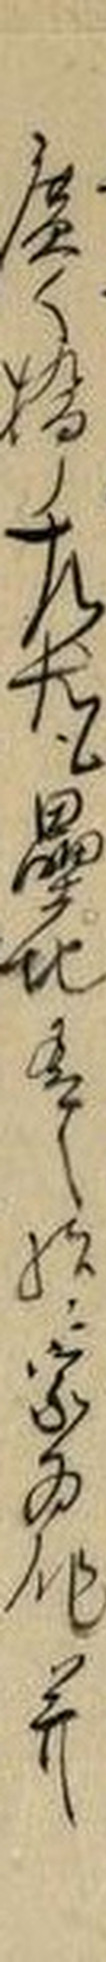広く橋ノ左右も塁地有之様に家為作并
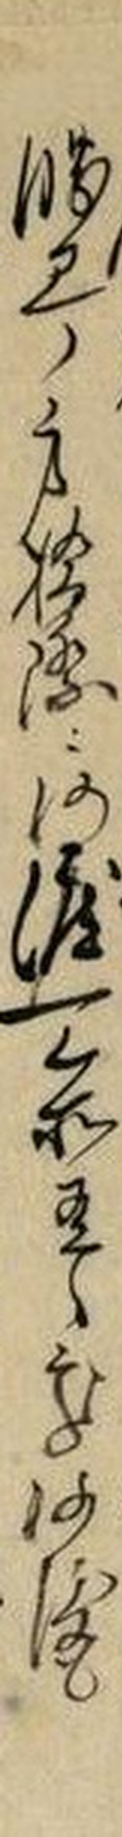勝見ノ方橋際に河渡一ケ所有之処河渡も
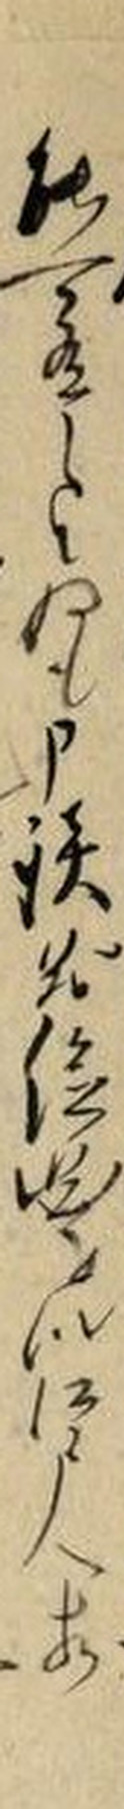能可有之と何も申談則絵図を以江戸へ相
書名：御城下諸事之部
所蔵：福井県文書館 Fukui Prefectural Archives
